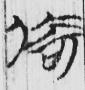倚
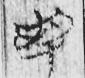受
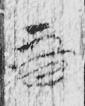○（期）
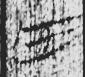甲
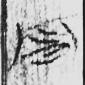晨
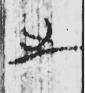之
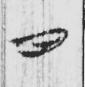日
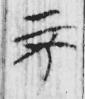不
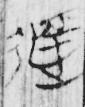𬨭（將）
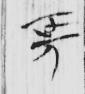長
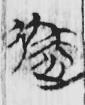○（沙）
